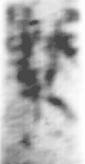贏
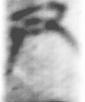尹
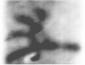之
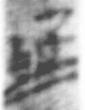爲
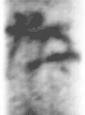○（左）
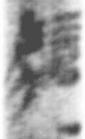驂
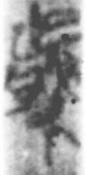贏
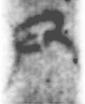尹
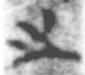之
